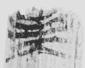異
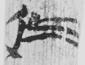於
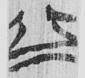丘
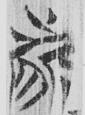之所
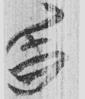昏（聞）
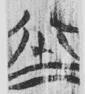丘
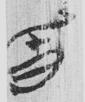昏（聞）
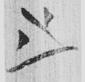之
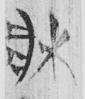牀（臧）
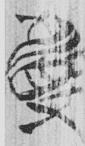{民且又}（文）
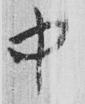仲
